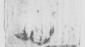卅
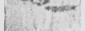一
